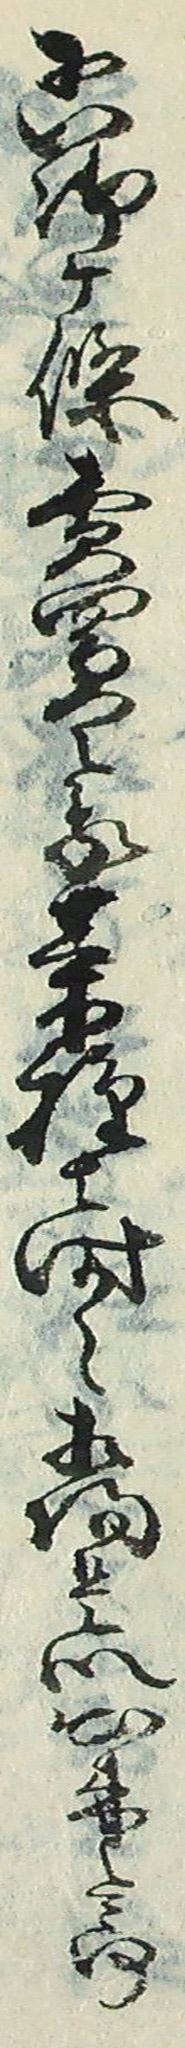右御ケ條売買之義菜種者時々相場是以出来之節
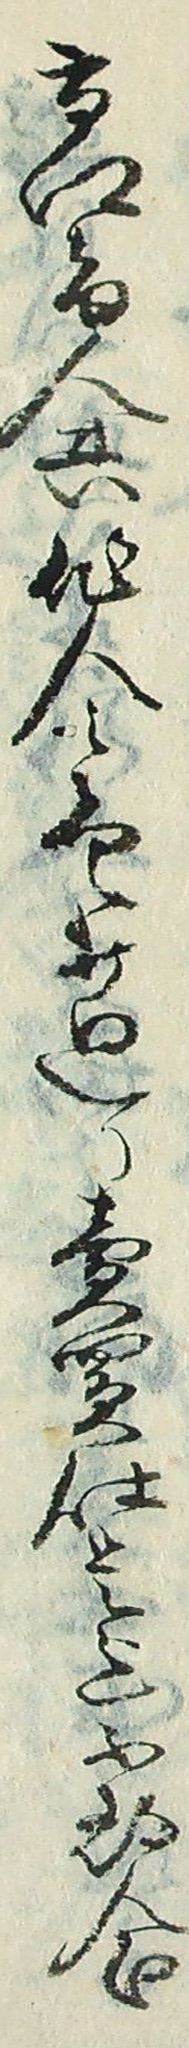市郷商人共作人之者へ打廻り売買仕是迄不都合
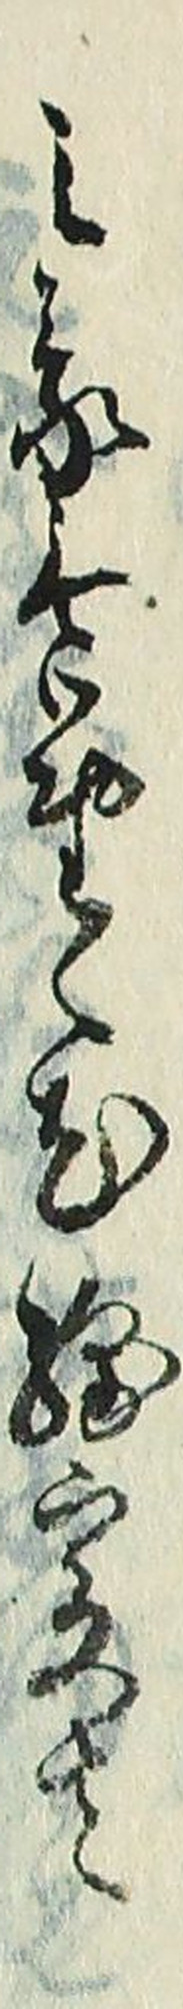之義無御座候尤綿実者
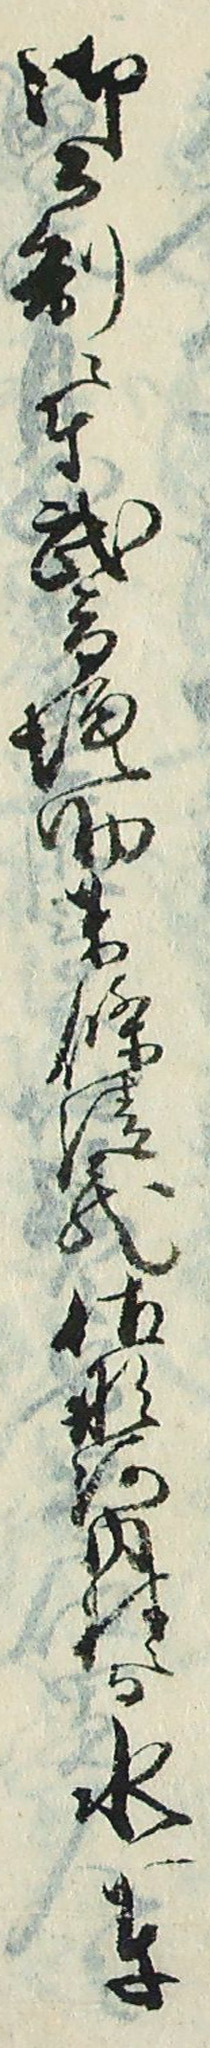御公制に付武市増助末條清蔵佐那河内村にて水車

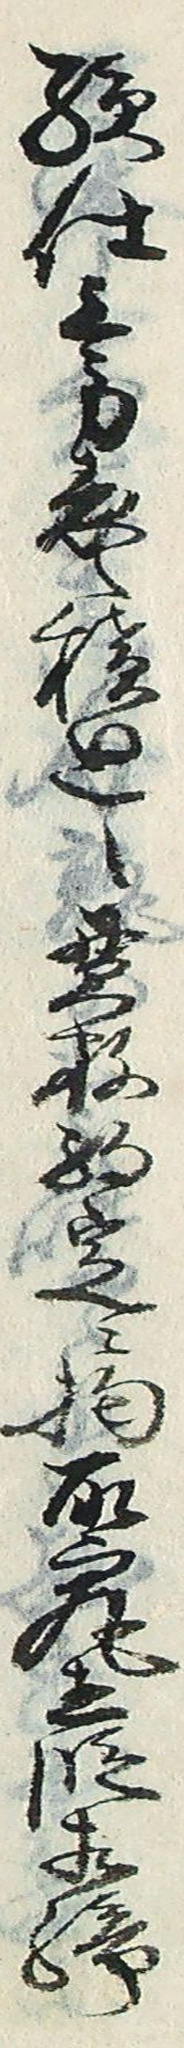絞仕上方表へ積廻し貫数約定に拘取究直段相締
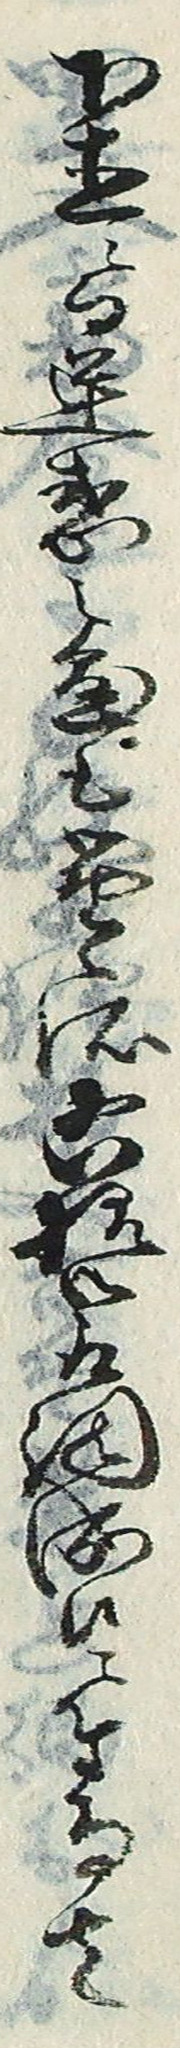下直に而迷惑之懸も御座候所右様御取調成候ニ付而者
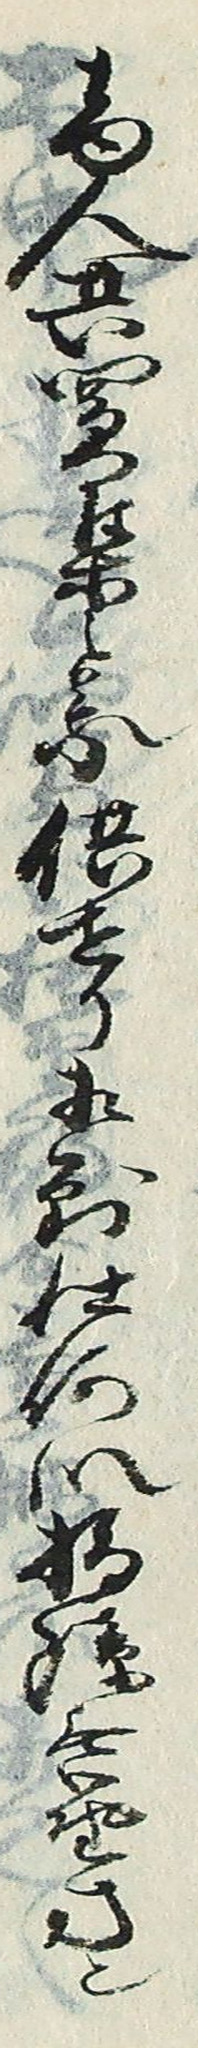商人共買集之義供せり相対仕何以指障無御座方と
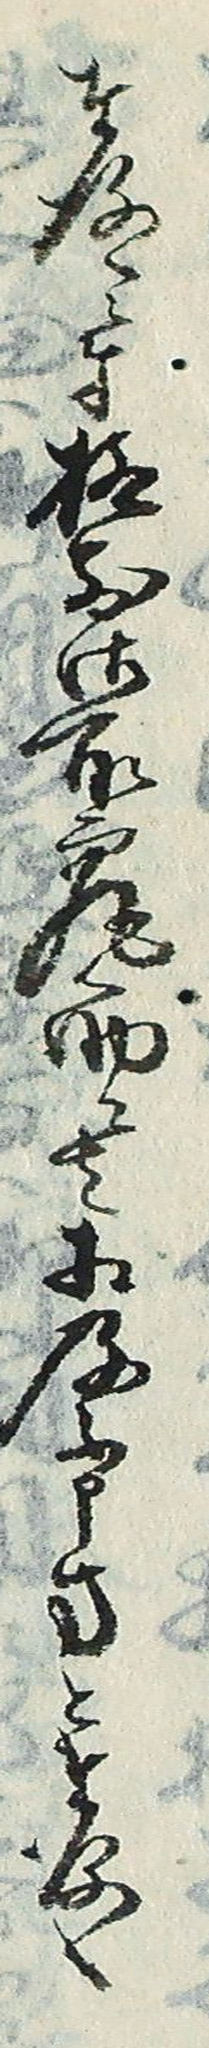奉存候に付格別御取究筋に者相及不申方と奉存候
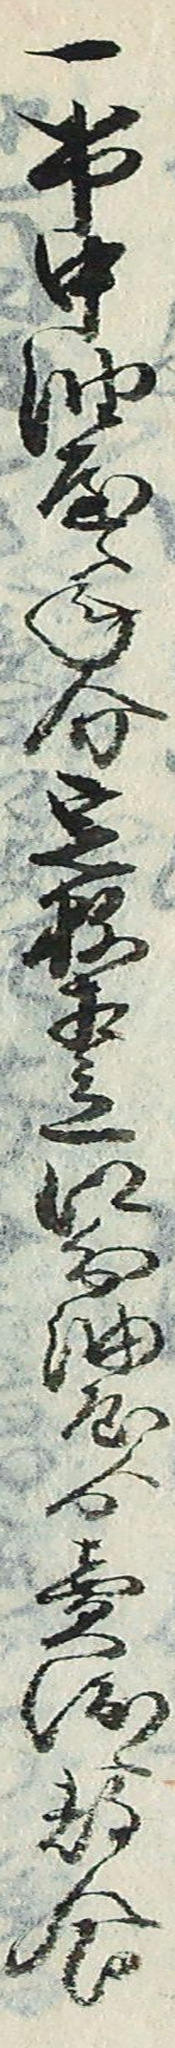一市中油屋之手分定数相立郷分油屋ゟ売渡候都合
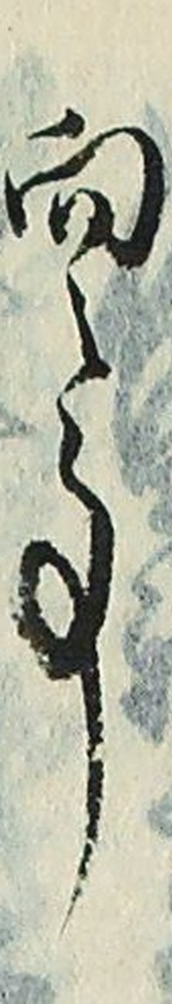向之事
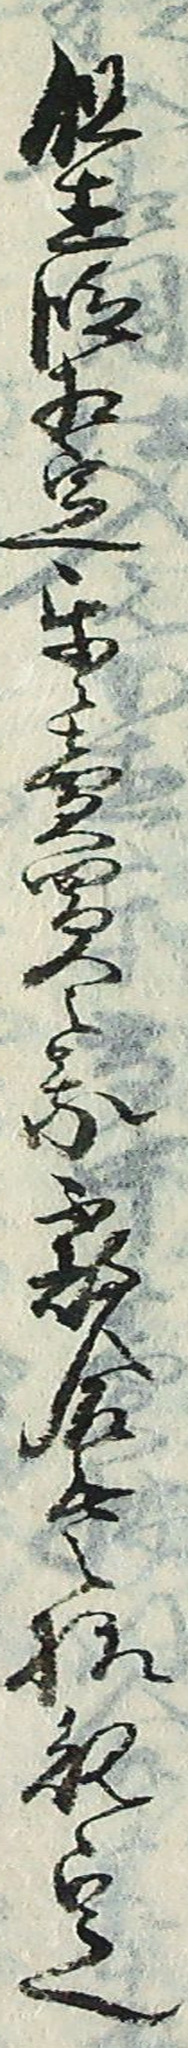但直段相定互に売買之義不都合無之様規定
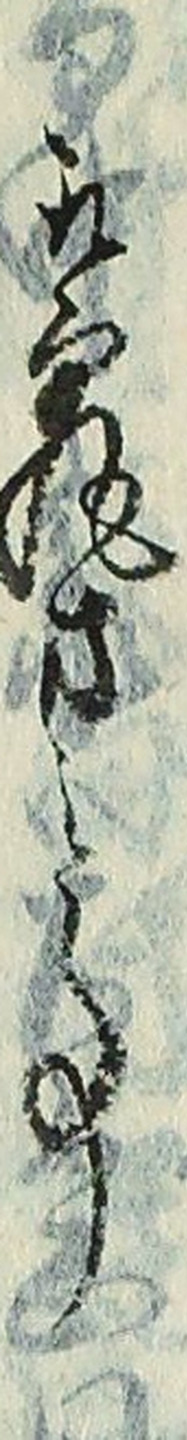取究方之事
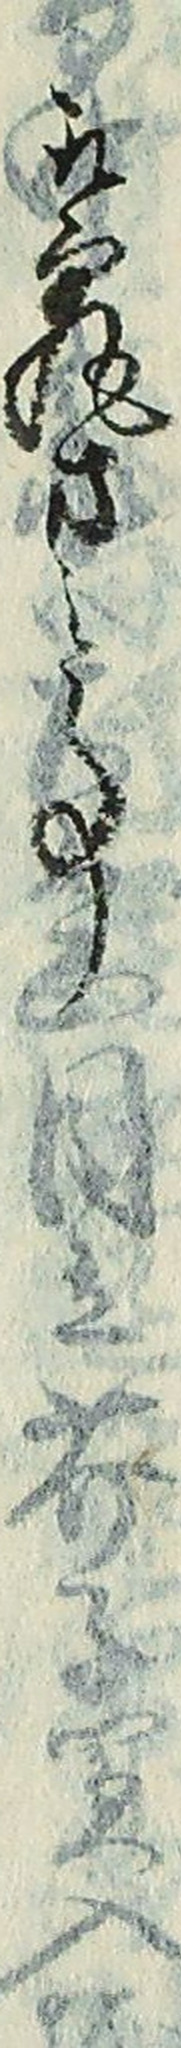取究方之事
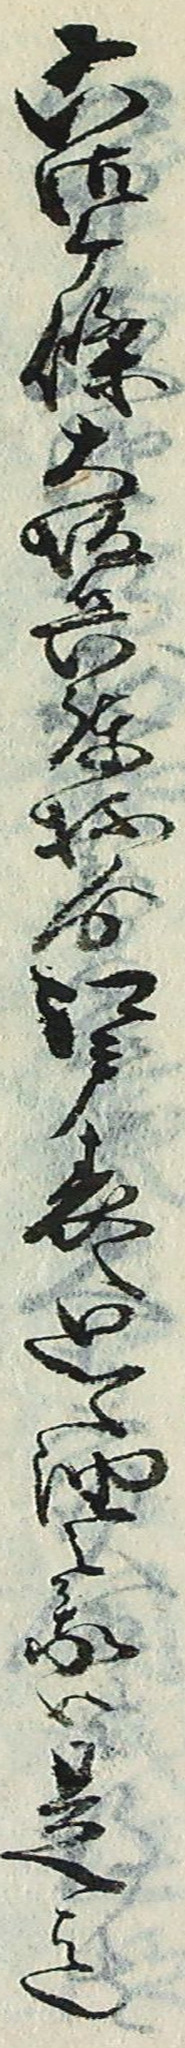右御ケ條大坂兵庫抔ゟ江戸表へ廻候油之義は是迄
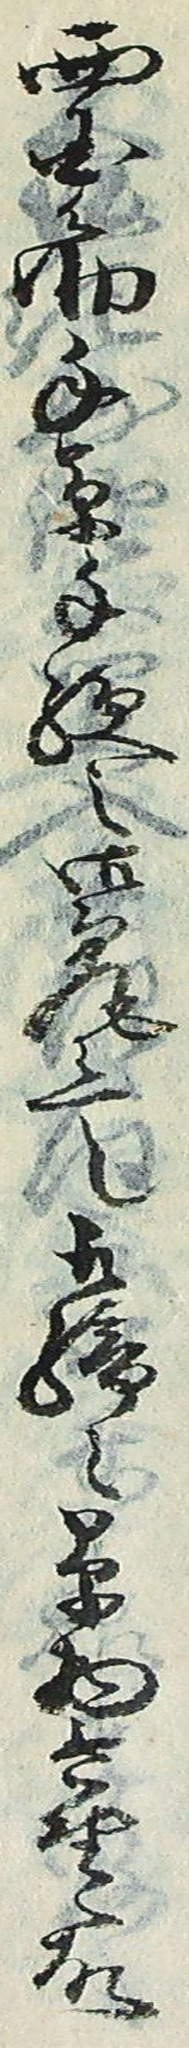西国筋手草手絞御究有之取締之草物無御座候故
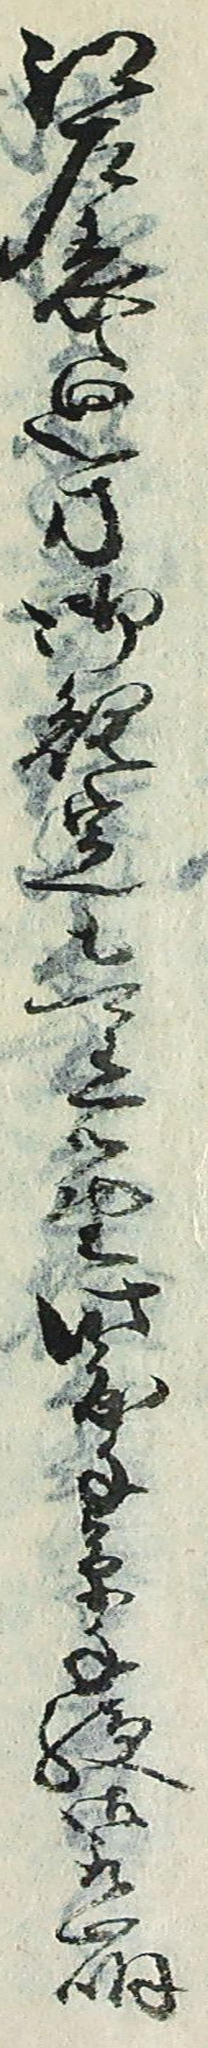江戸表へ廻方御規定も可有御坐此度手草手絞御
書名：油稼御取究ニ附御箇條書テ以被仰渡南北同役申談御答書控
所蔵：鳴門教育大学 Naruto University of Education
